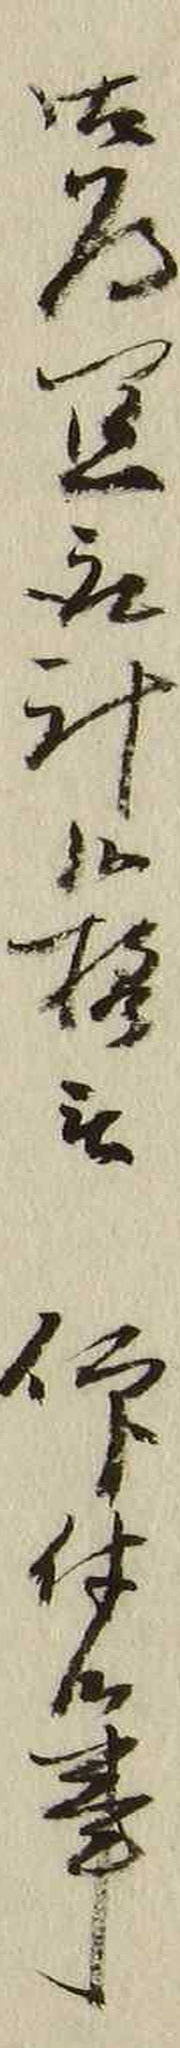御為宜取計候様被仰付候事
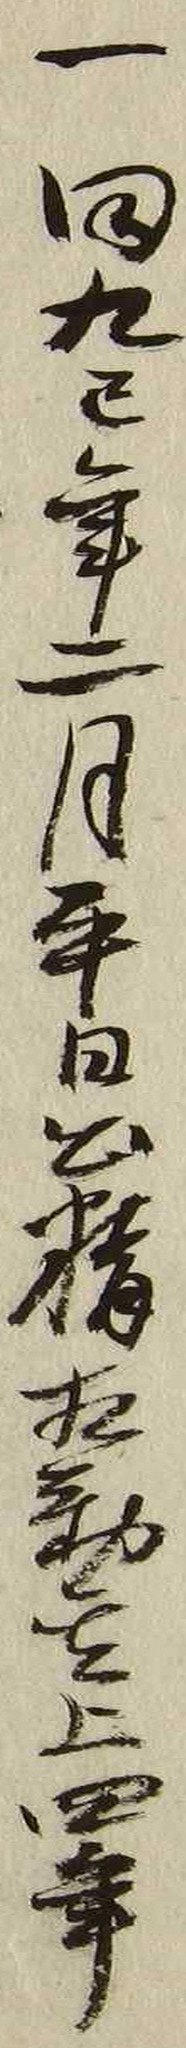一同九巳年二月平日出精相勤其上四年
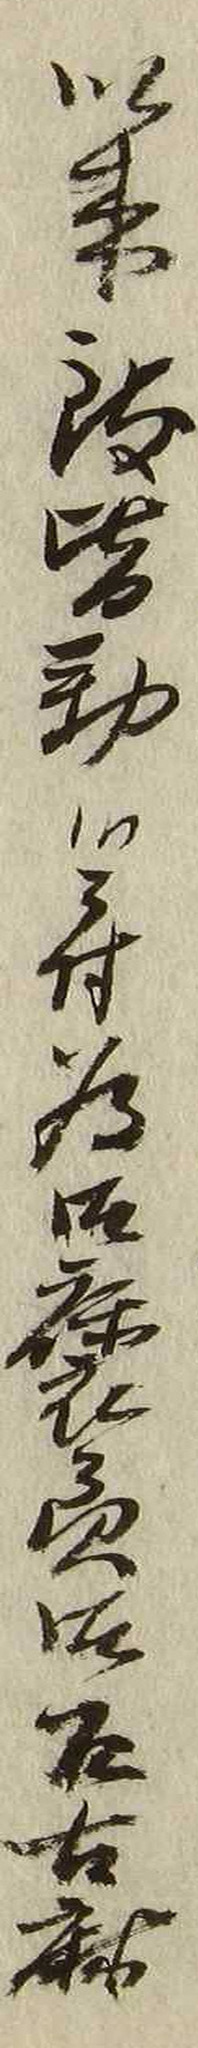以来致皆勤候ニ付為御褒美御召古麻
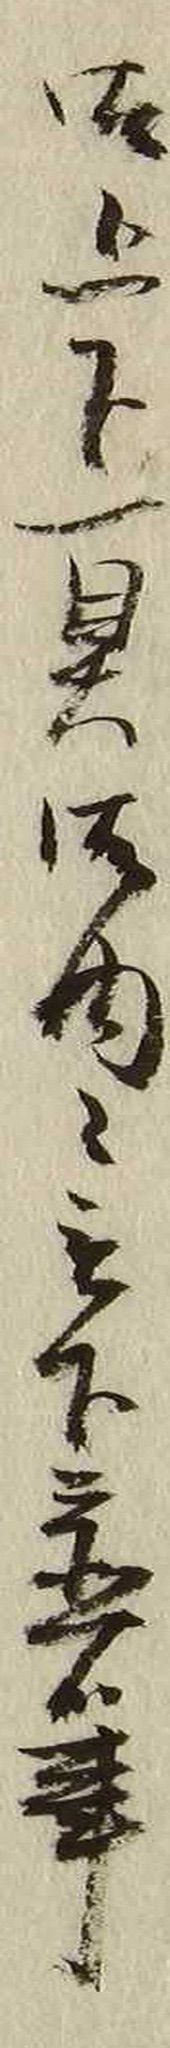御上下一具御内々被下置候事
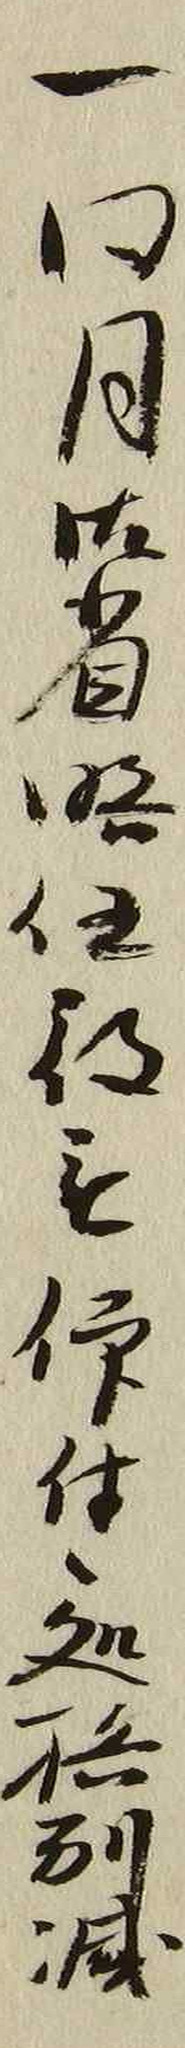一同月御省略任役被仰付候処格別減
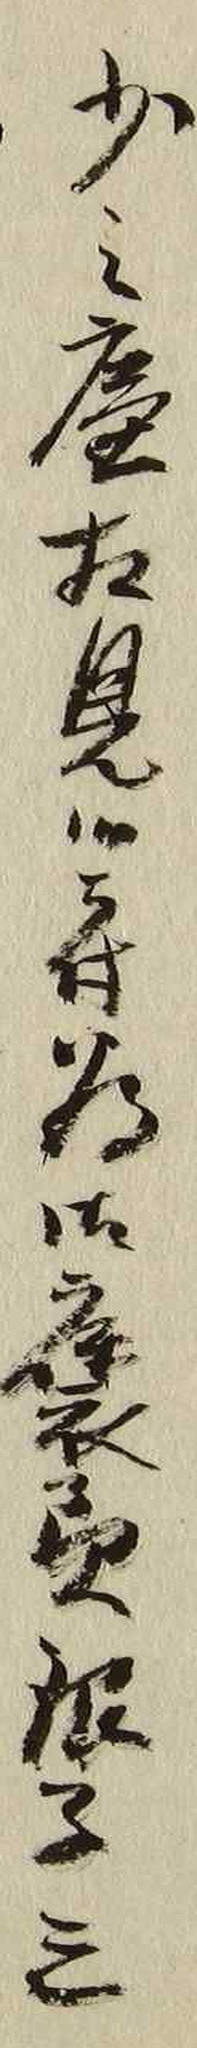少之廉相見候ニ付為御褒美銀子三
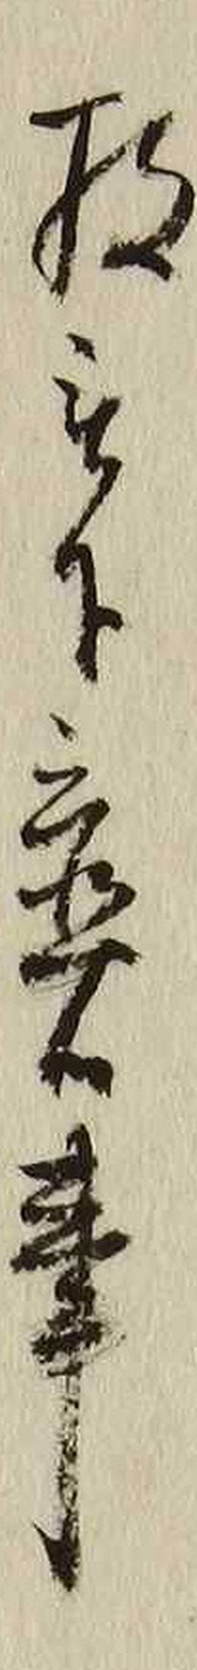枚被下置候事
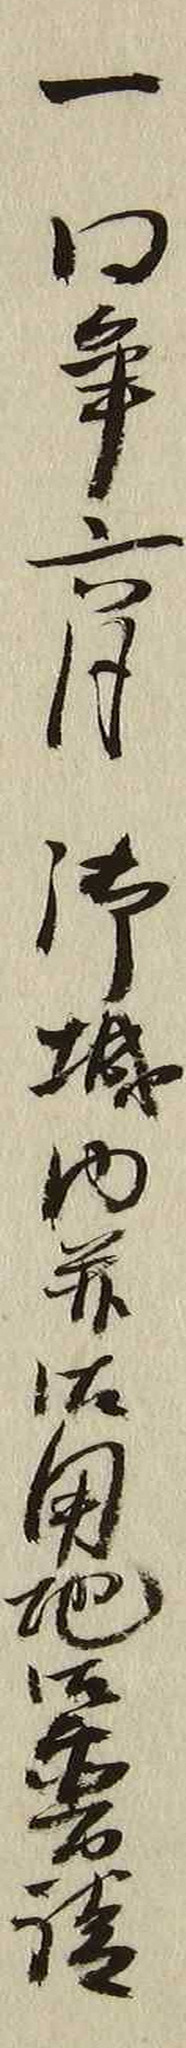一同年六月御城内并御用地御普請
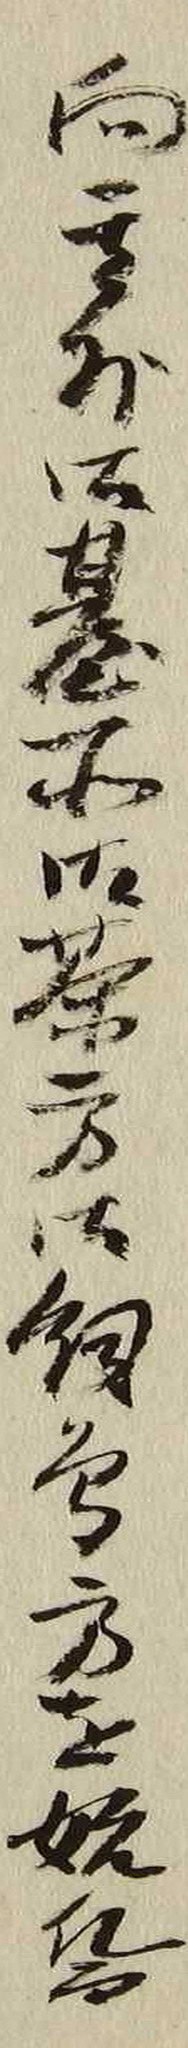向其外御台所御茶方御飼鳥方を始凡而
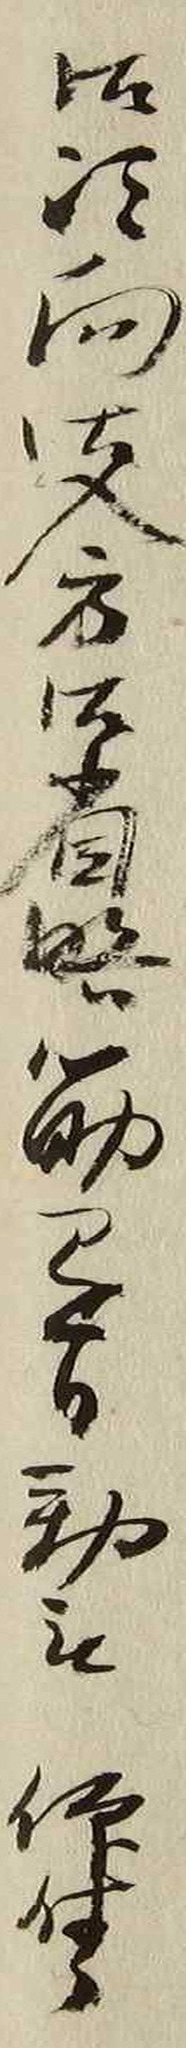御次向御入方御省略筋懸り勤被仰付候
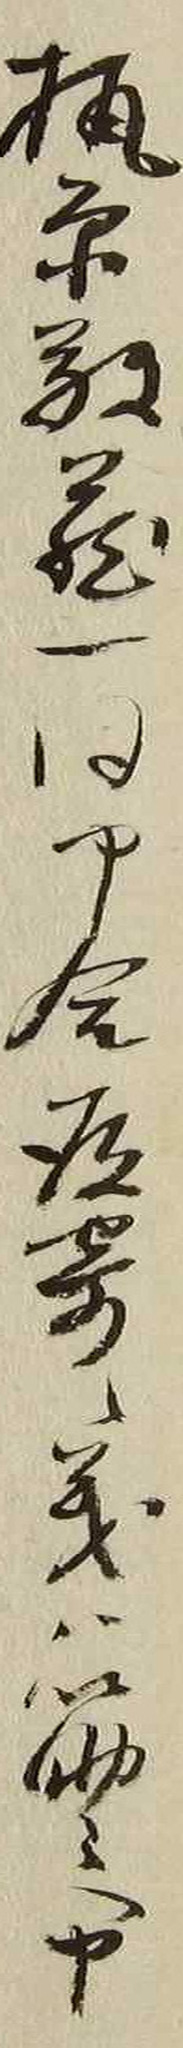梶原敬蔵一同申合取寄候義ハ筋々へ申
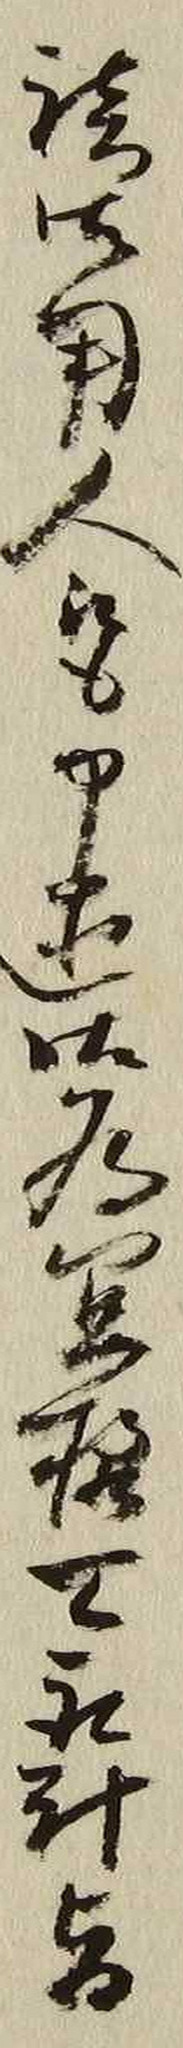請御用人江も申述御為宜様可取計旨
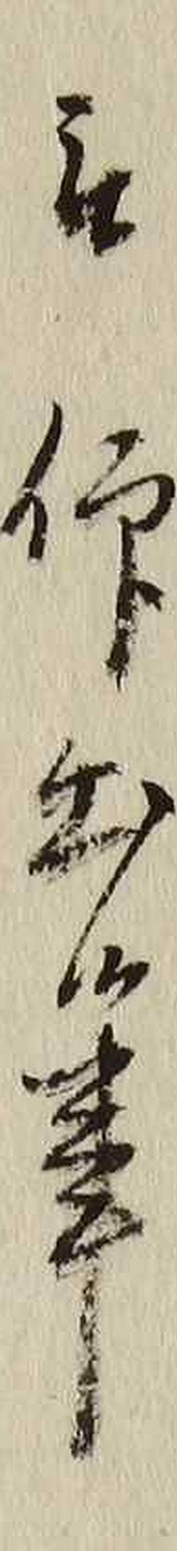被仰出候事
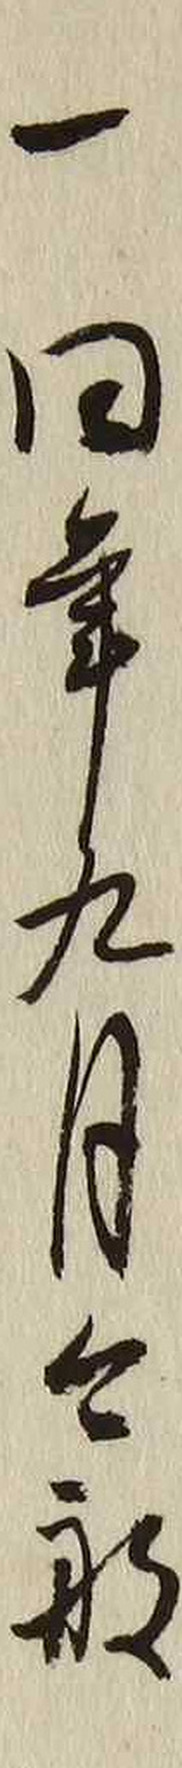一同年九月今般
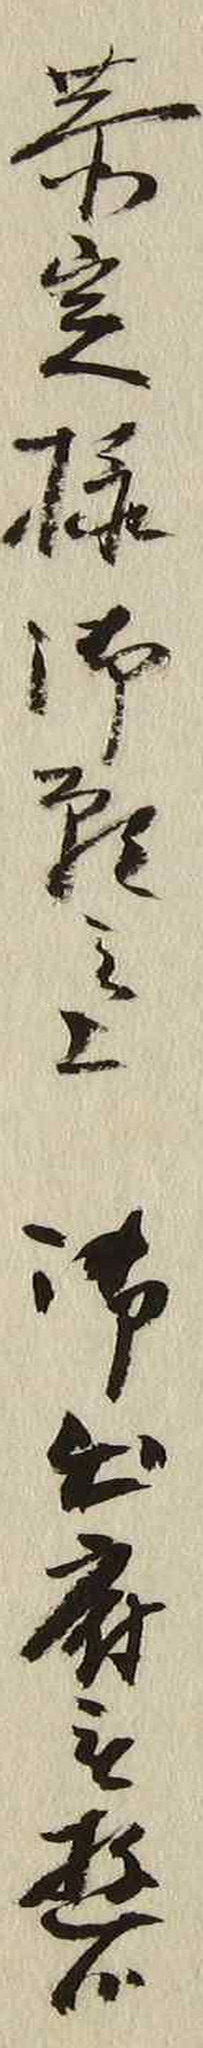恭定様御願之上御出府被遊候
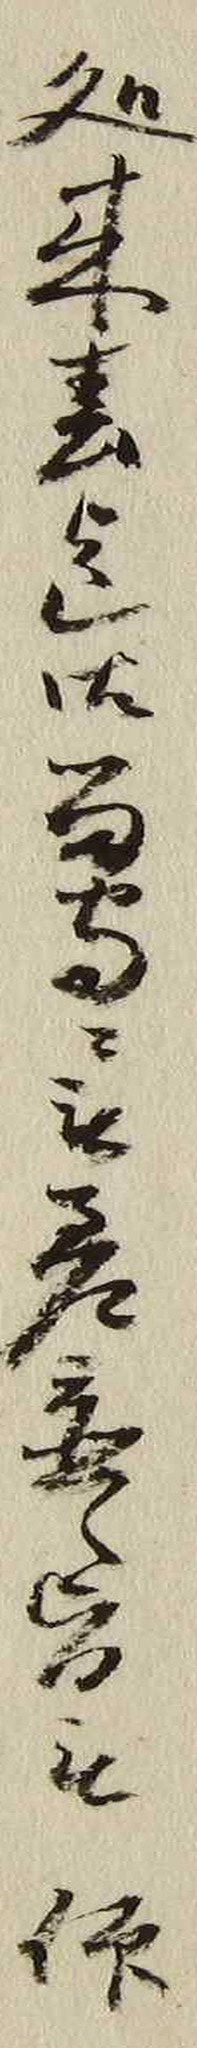処来春迄御留守ニ被差置候旨被仰
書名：諸士系譜　巻之345　も之部1
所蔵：会津若松市立会津図書館
